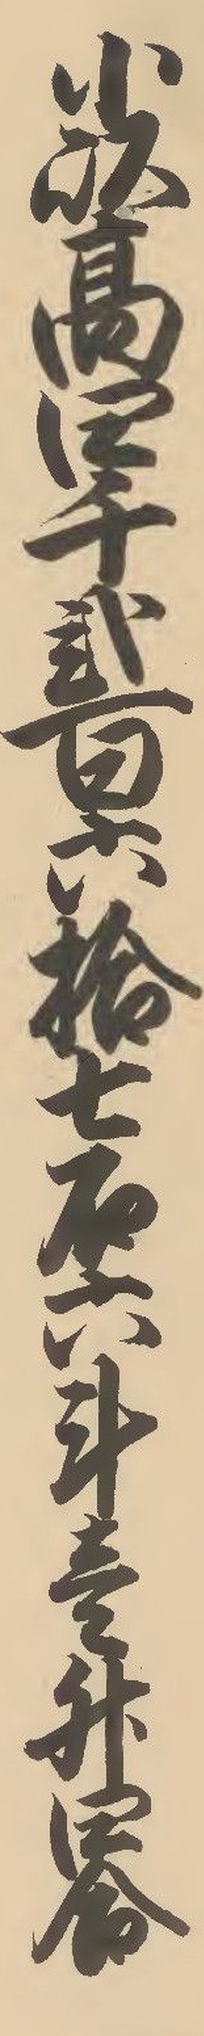小以髙四千弐百六拾七石六斗壱升四合
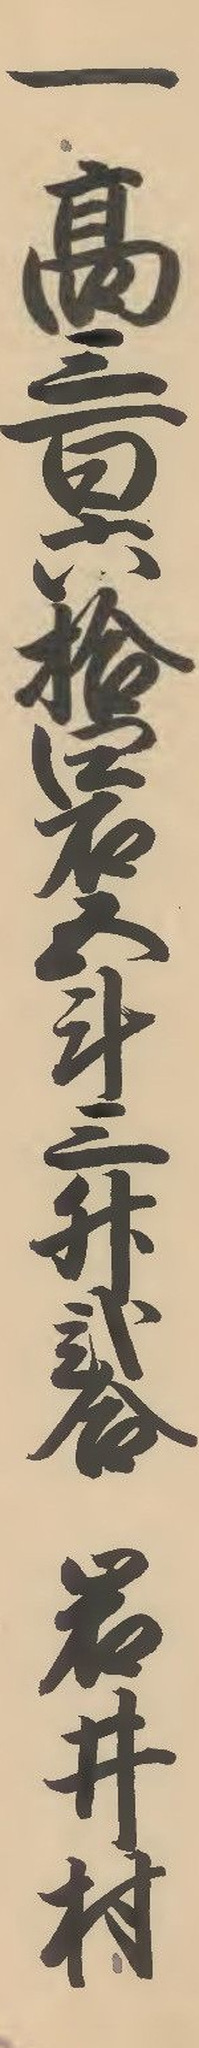一髙三百六拾四石五斗三升弐合岩井村
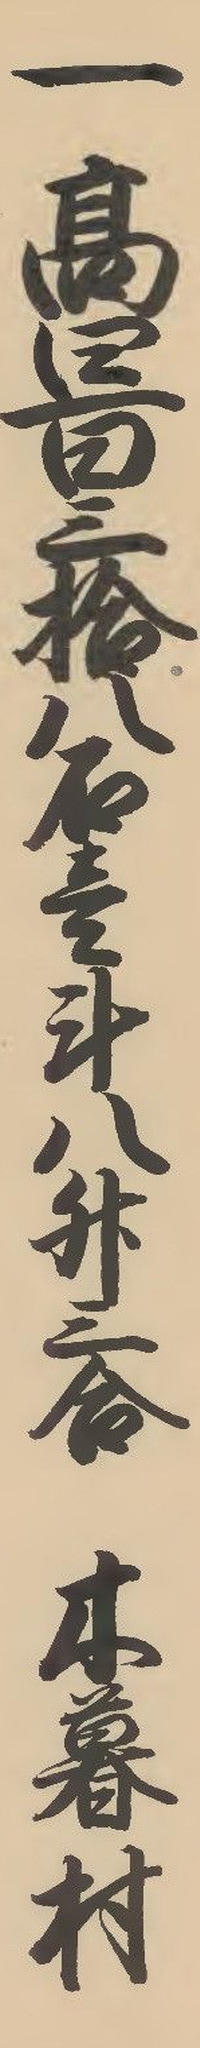一髙四百三拾八石壱斗八升三合木暮村

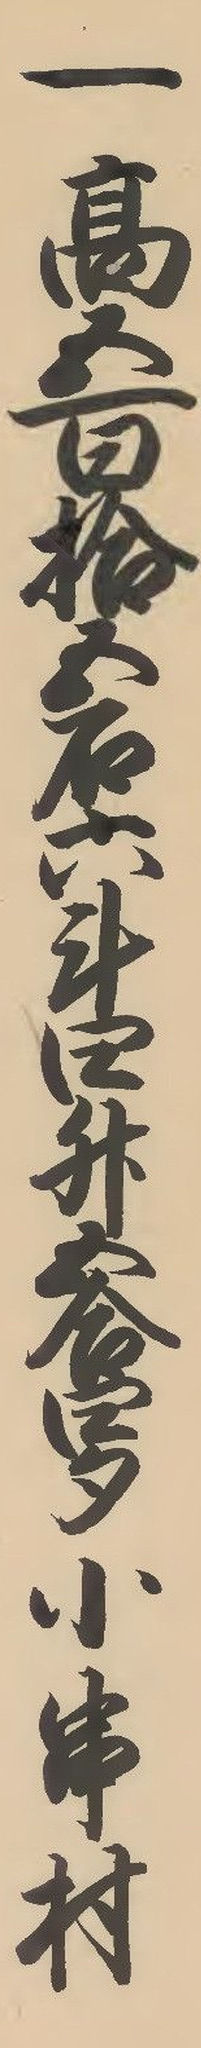一髙五百拾五石六斗四升五合四夕小串村
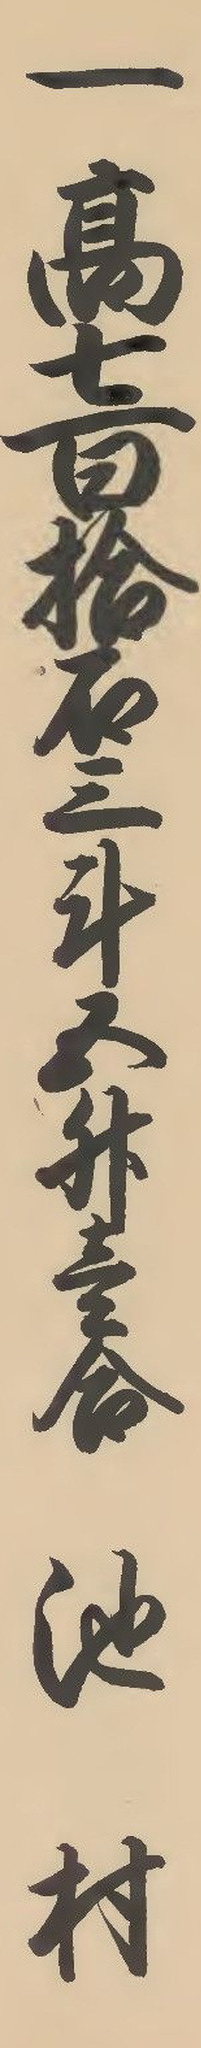一髙七百拾石三斗五升壱合池村
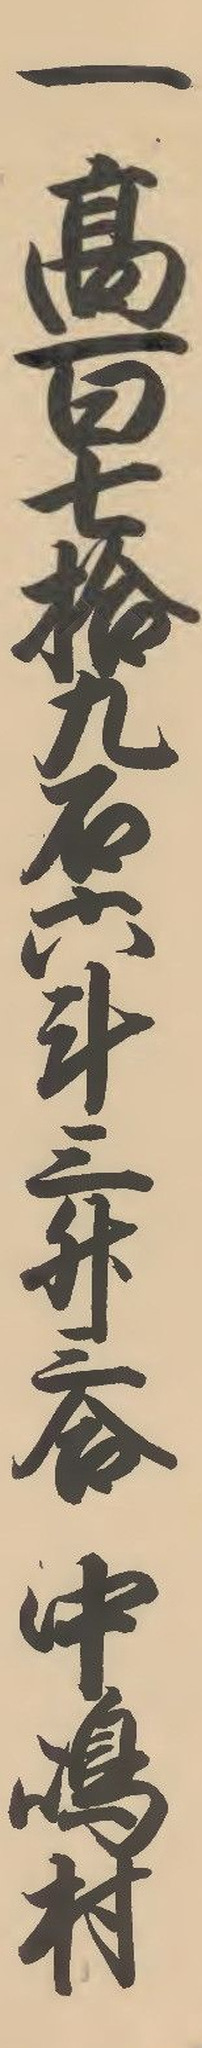一髙百七拾九石六斗三升三合中嶋村
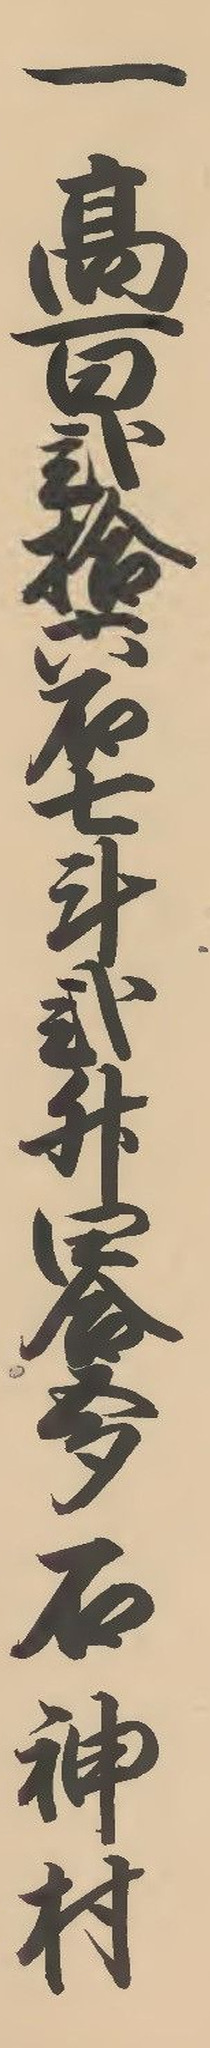一髙百弐拾六石七斗弐升四合五夕石神村
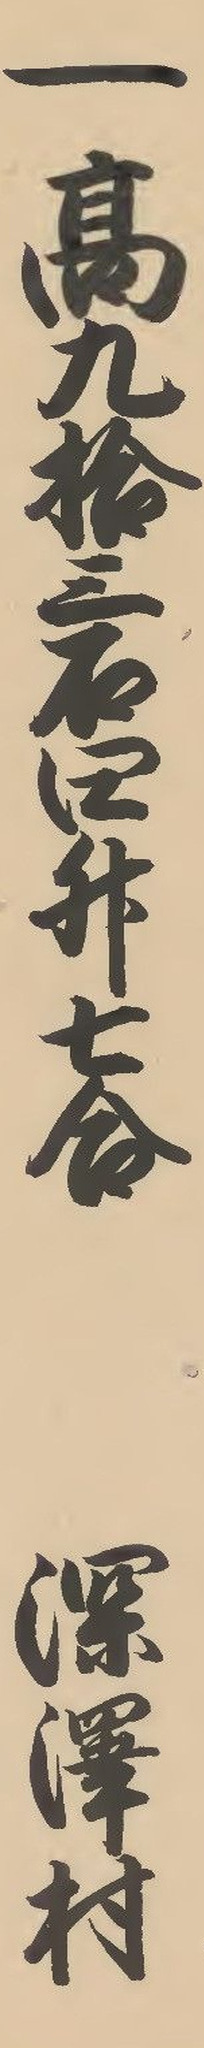一髙九拾三石四升七合深澤村
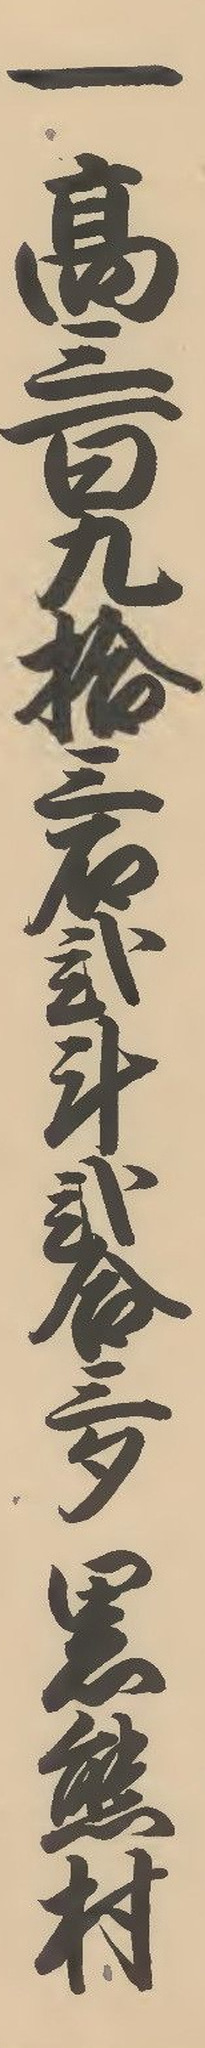一髙三百九拾三石弐斗弐合三夕黑熊村
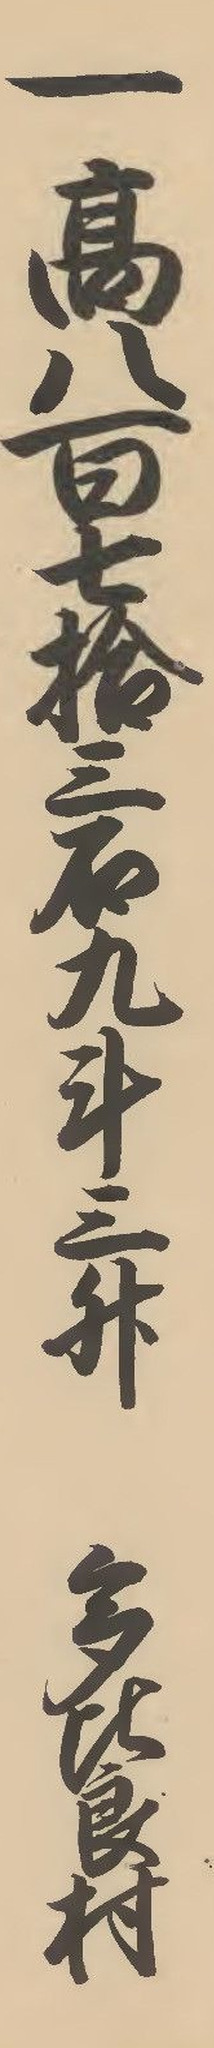一髙八百七拾三石九斗三升多比良村
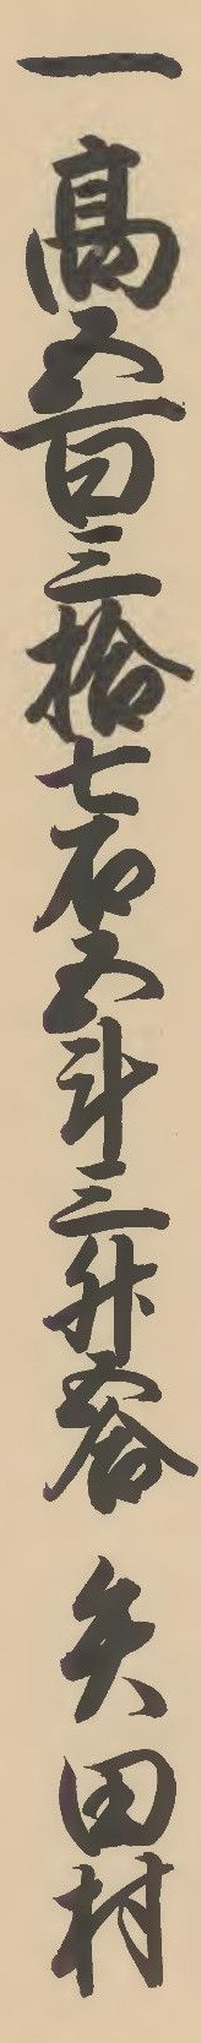一髙五百三拾七石五斗三升五合矢田村

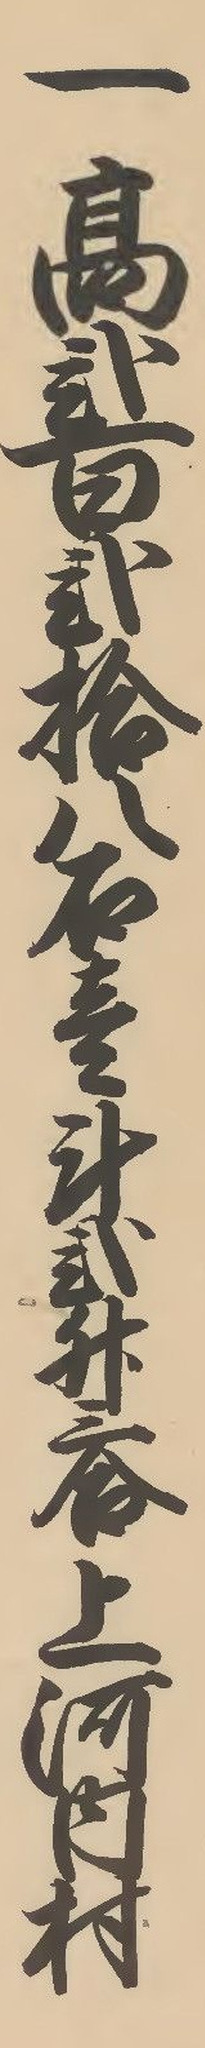一髙弐百弐拾八石壱斗弐升三合上河内村
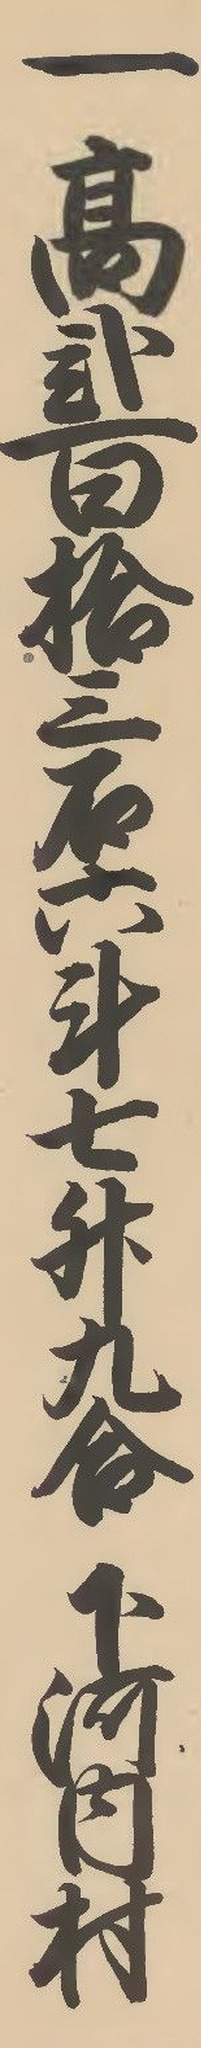一髙弐百拾三石六斗七升九合下河内村
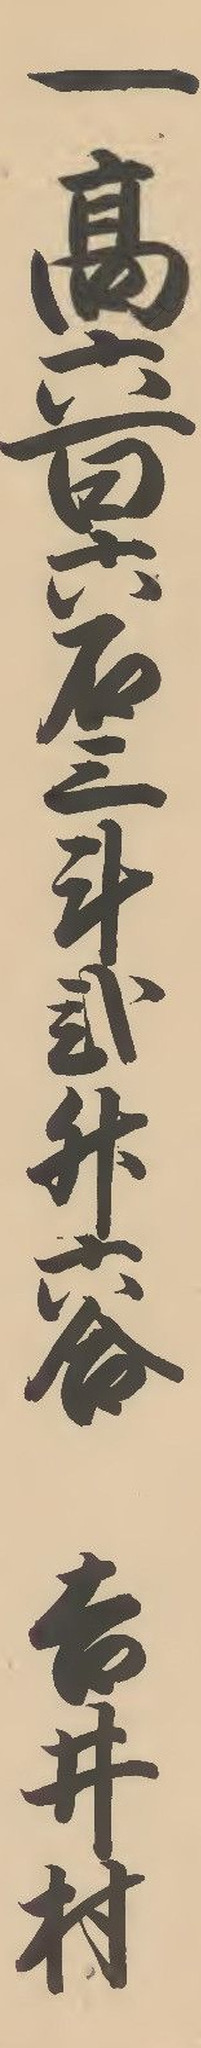一髙六百六石三斗弐升六合吉井村
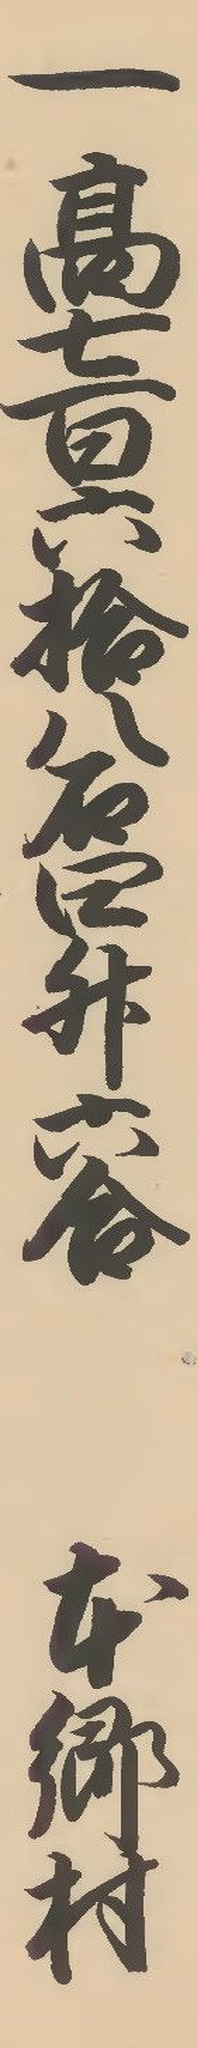一髙七百六拾八石四升六合本郷村
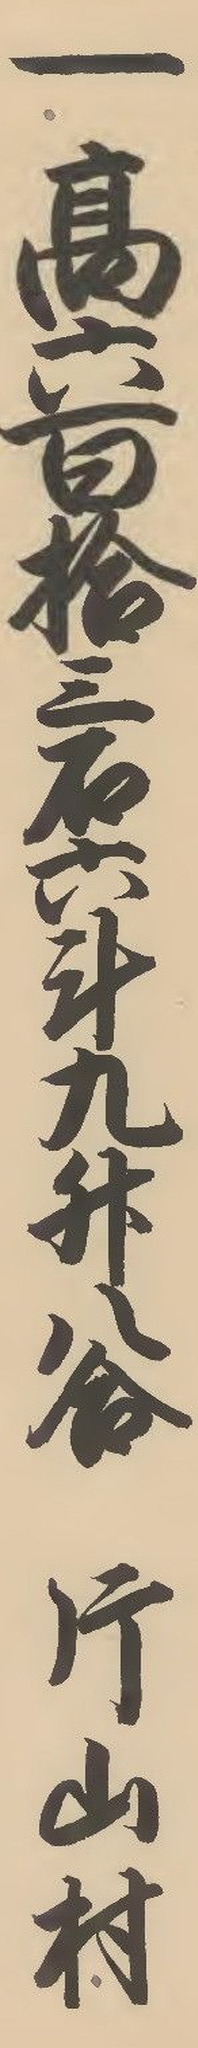一髙六百拾三石六斗九升八合片山村
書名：上野国郷帳
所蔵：国立公文書館 National Archives of Japan
